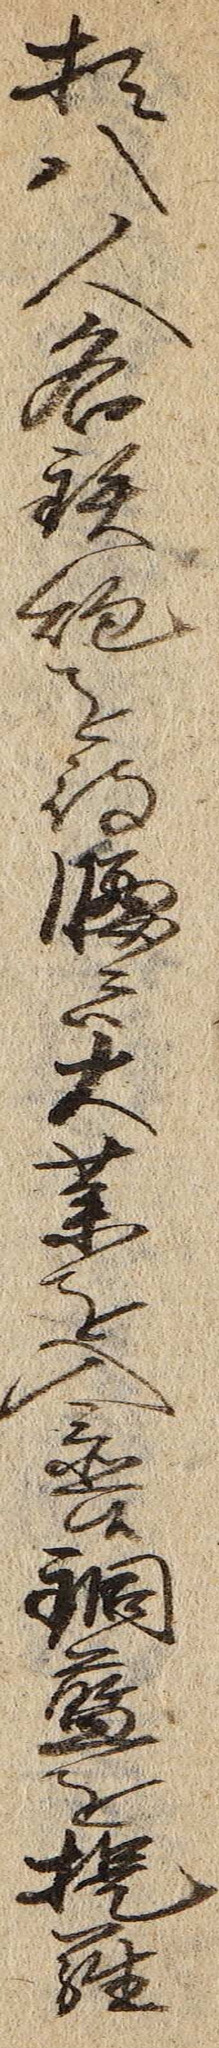十八人各鉄砲を待腰には火薬を入置候銅藍を提羅
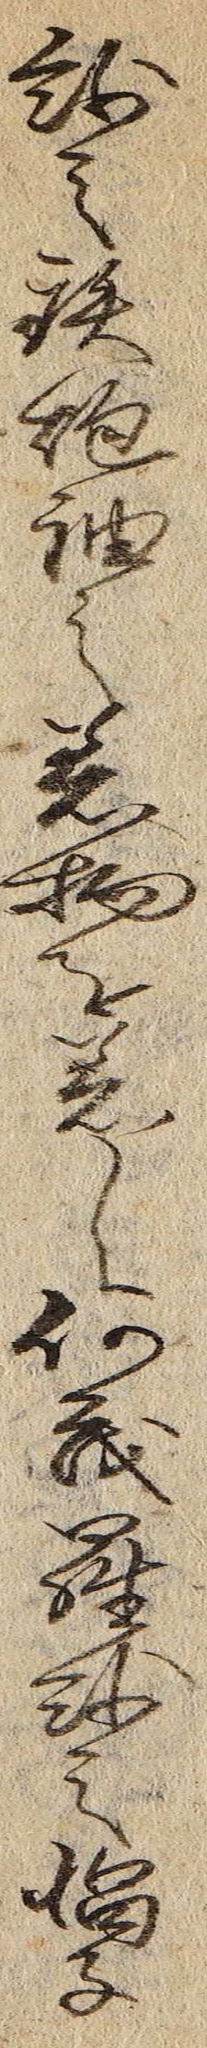紗の鉄砲袖の着物を着し何も羅紗の帽子
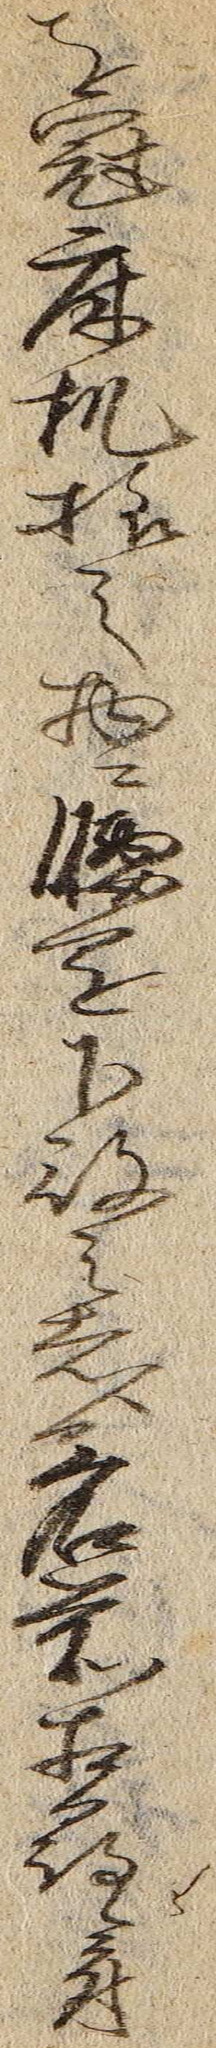を冠床几様の物に腰懸下役の者より名前相尋候に付
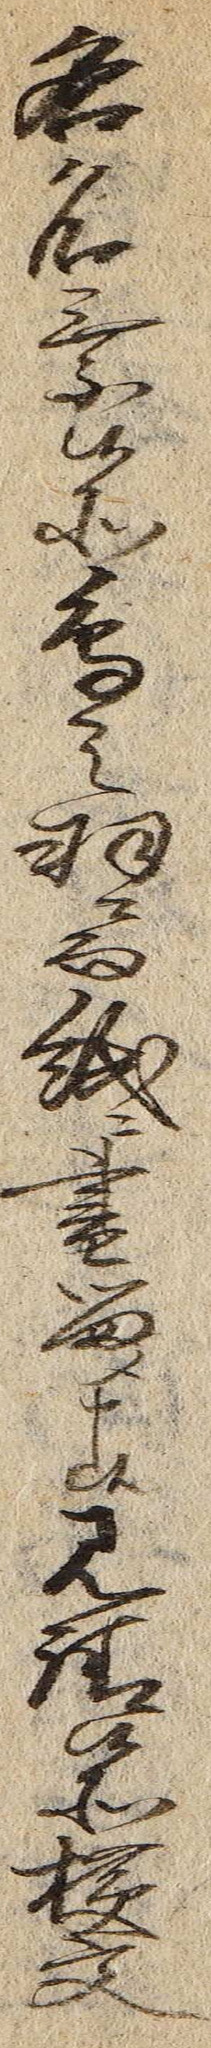名名乗候所鳥の羽にて紙に書留め申候見請候所横文
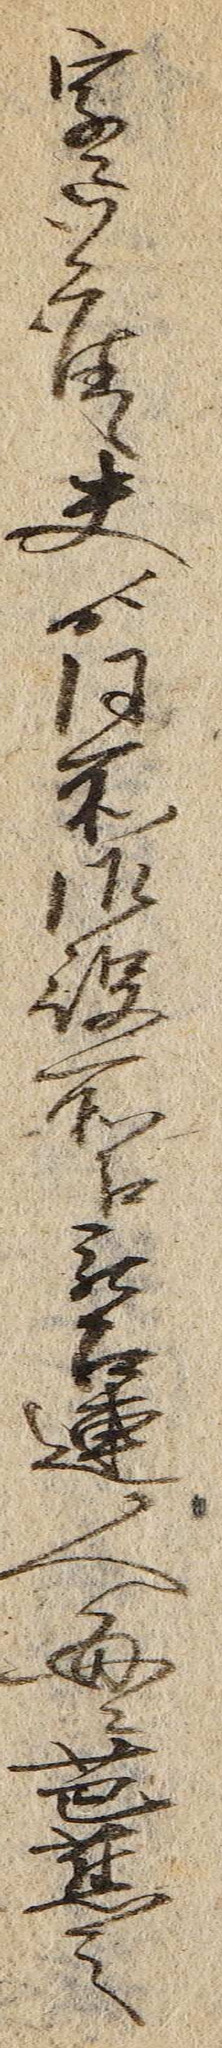字に御座候夫より同所御役所へ被召連人毎に芭蕉の
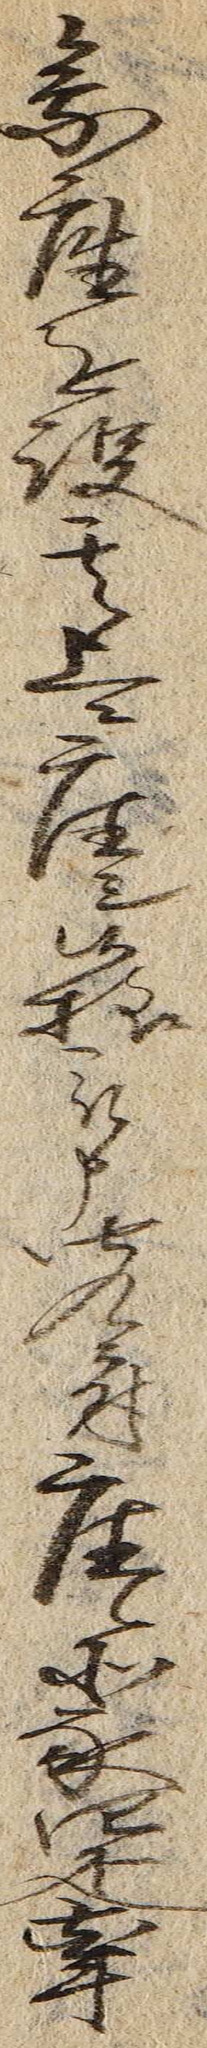円座を設其上に座し候様被申聞候に付座候所豕四匹牽
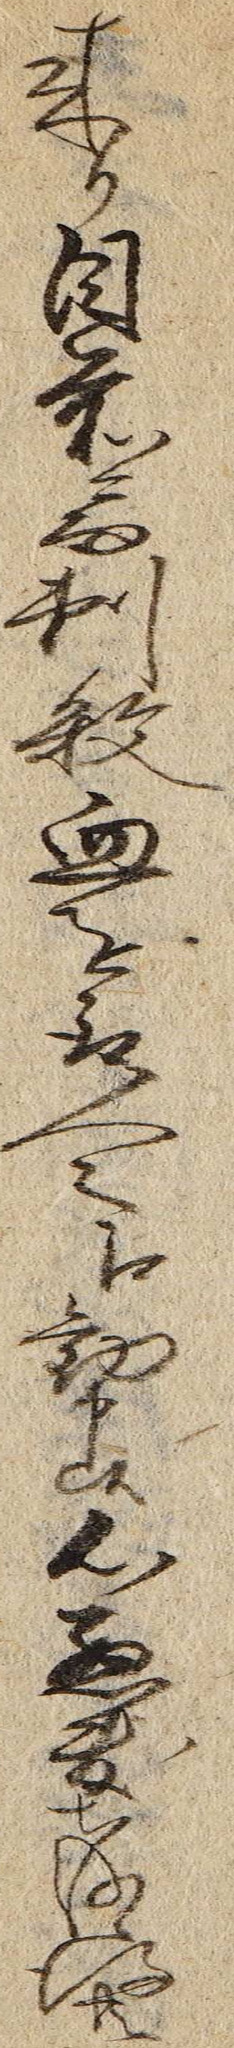来り目前にて刺殺血を取人々へ勧申候心悪しく存候得ども
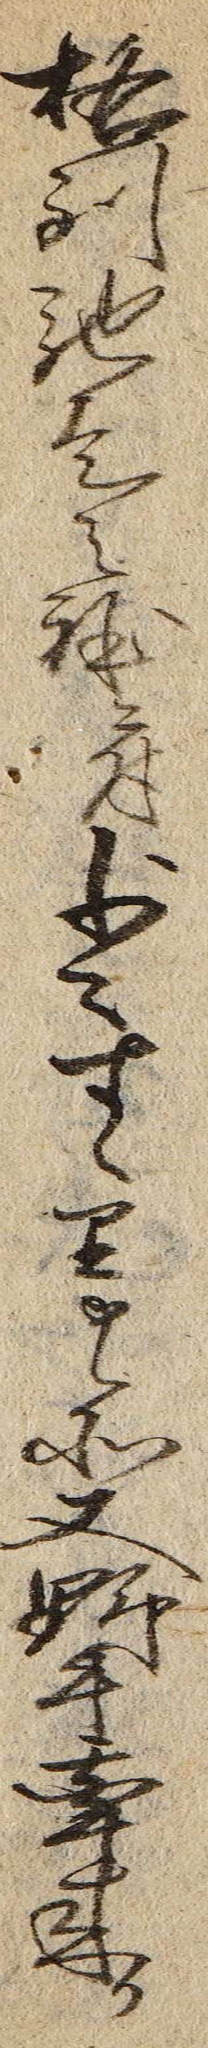格別馳走の体に付少々すゝり申候所又野牛牽来り
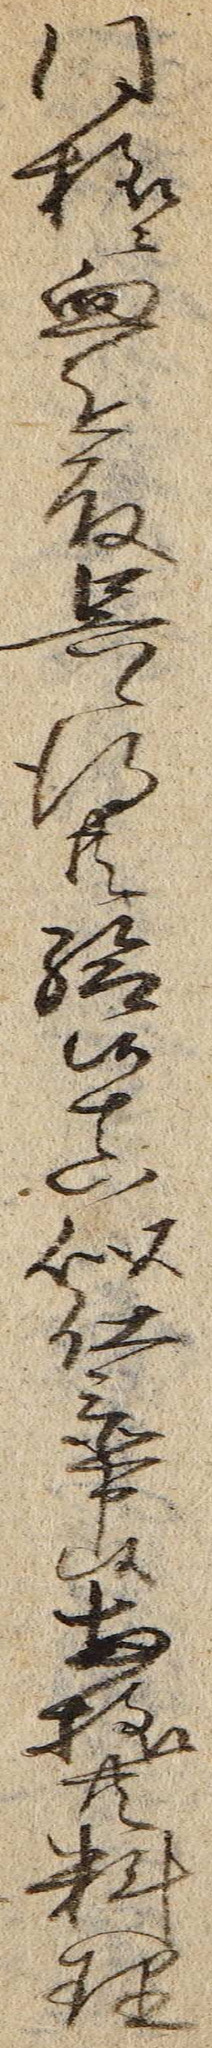同様に血を取呉候得ども給候真似仕置申候両様とも料理
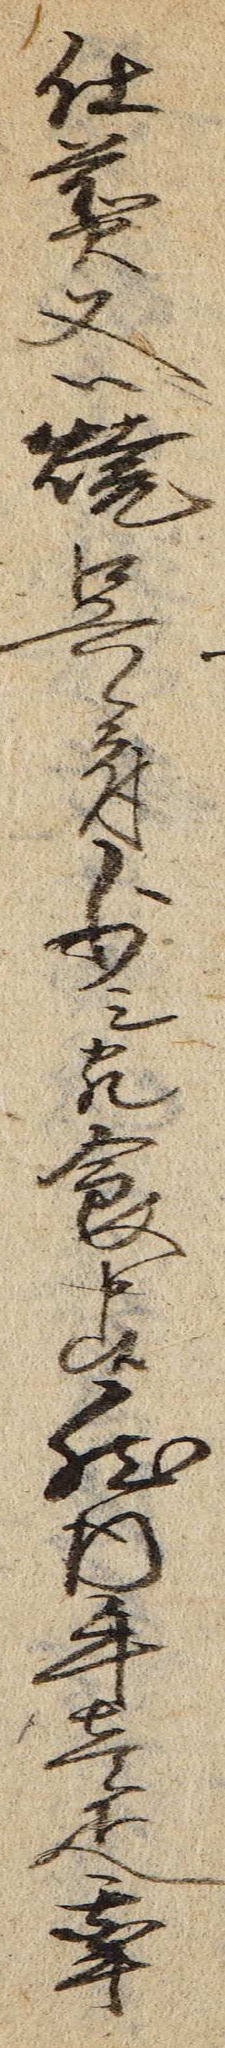仕煎又は焼呉候に付少しずつ食申候然内牛一匹牽
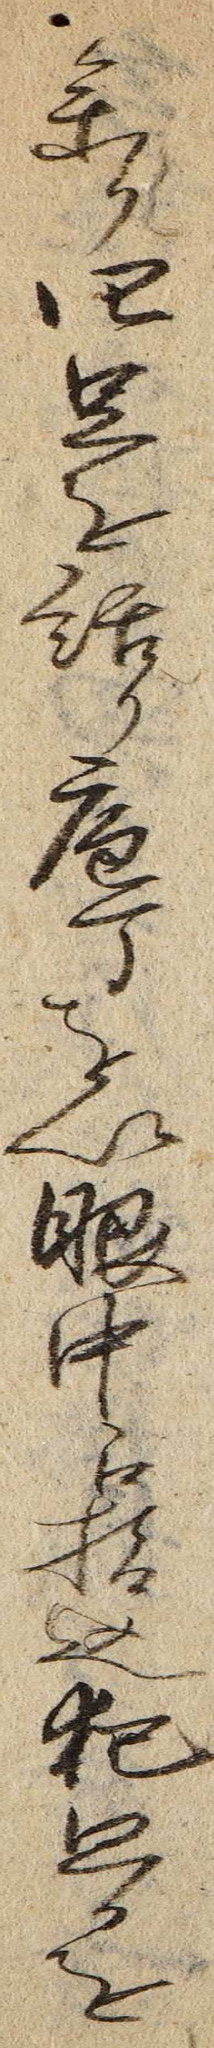参り四足を括り包丁を以眼中へ指込犯廻るを

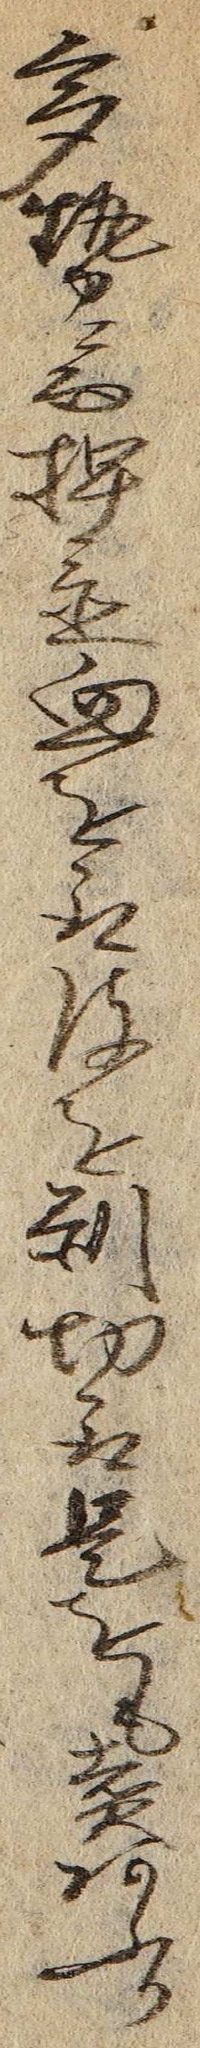多勢にて押置血を取皮を剥切取是をも煮あふり
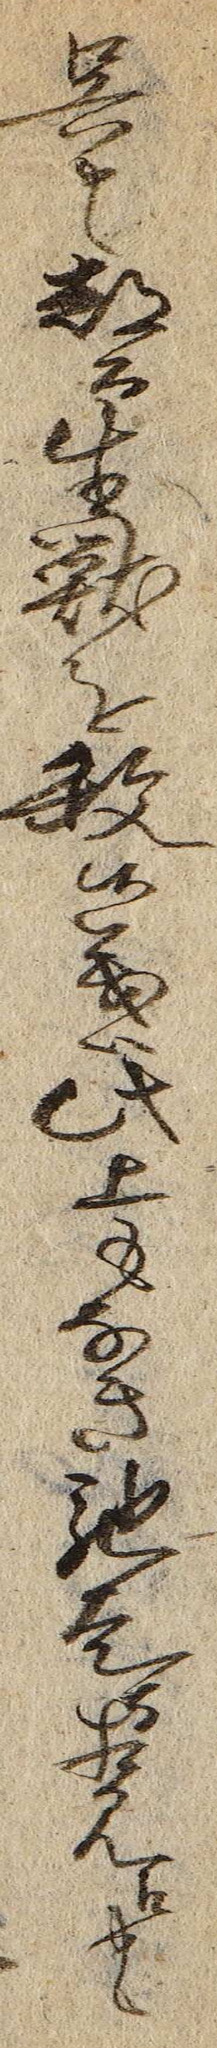呉申候都て生獣を殺候義は此上もなき馳走と相見へ申候
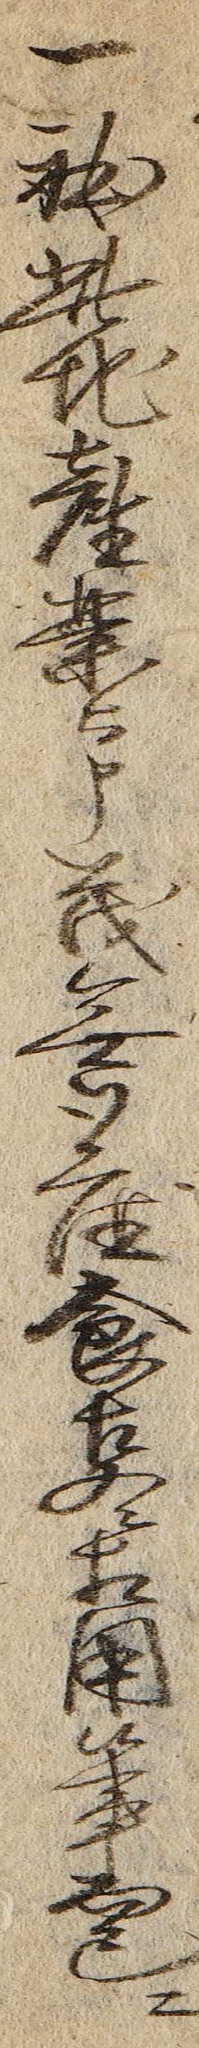一体此地産業と申も無御座食事に相用候事のみに
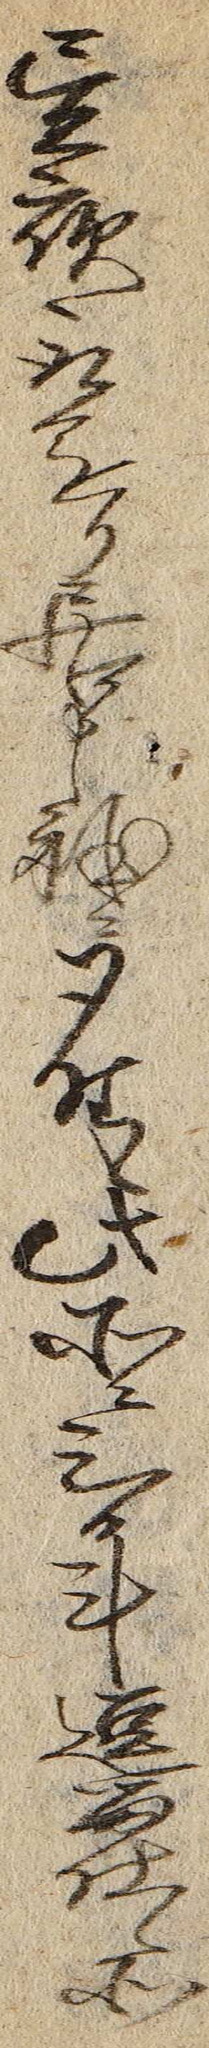昼夜取懸り居申候体御座候此所に三日斗逗留仕候所
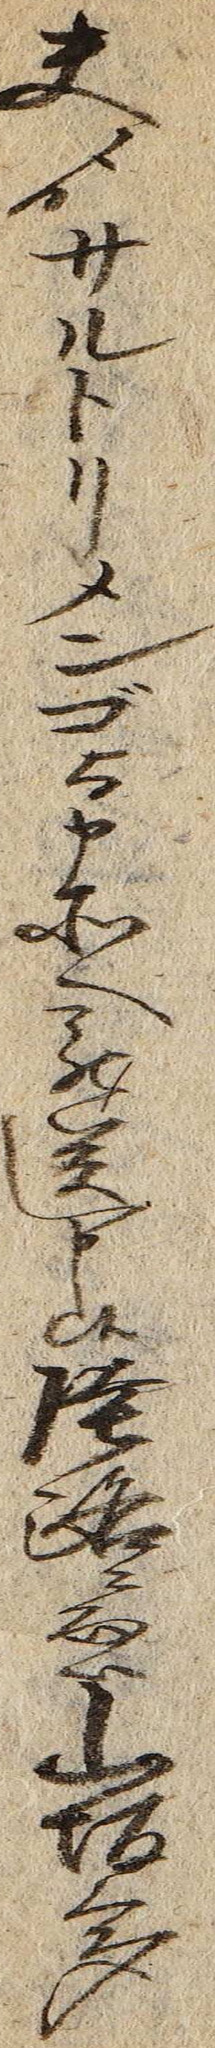それよりサルトリメンゴと申処へ罷送申候陸路にては山坂多
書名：能登国清兵衛異国江漂流之始末
